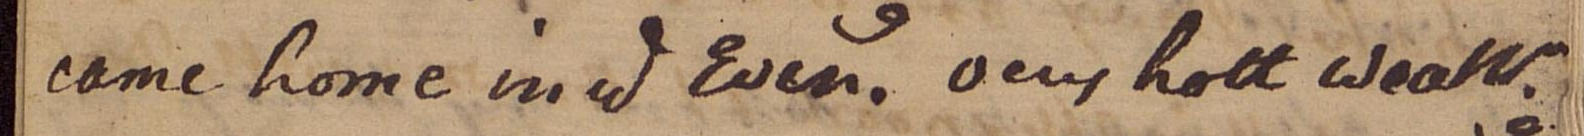came home in y^e Even^g. very hott weather.
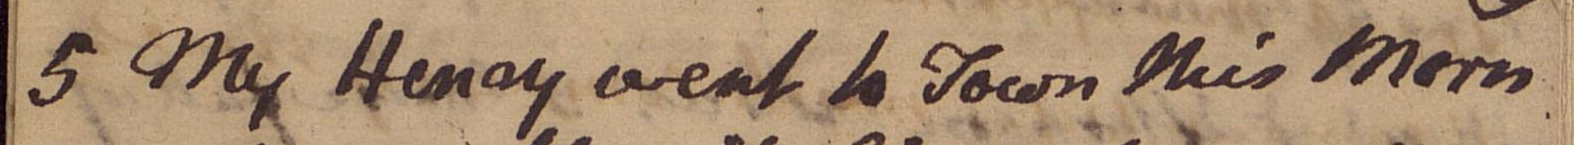5 My Henry went to Town this Morn^g
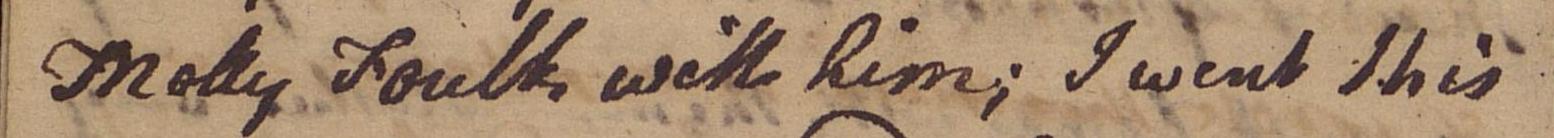Molly Foulk with him; I went this
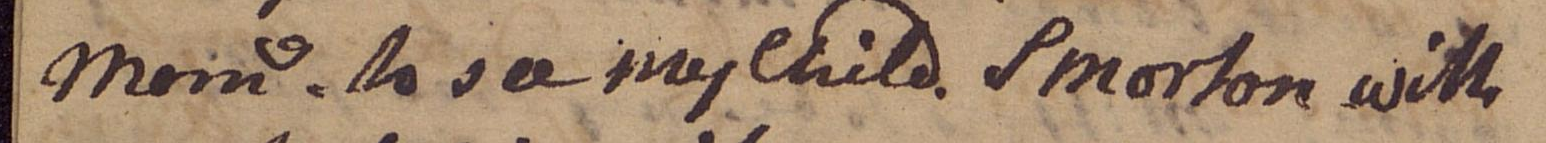Morn^g. to see my child, S Morton with
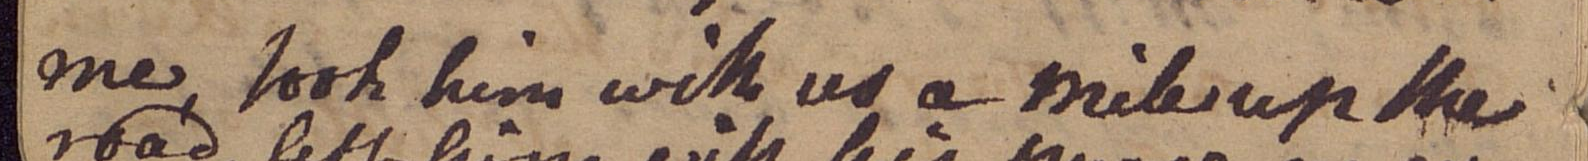me, took him with us a mile up the
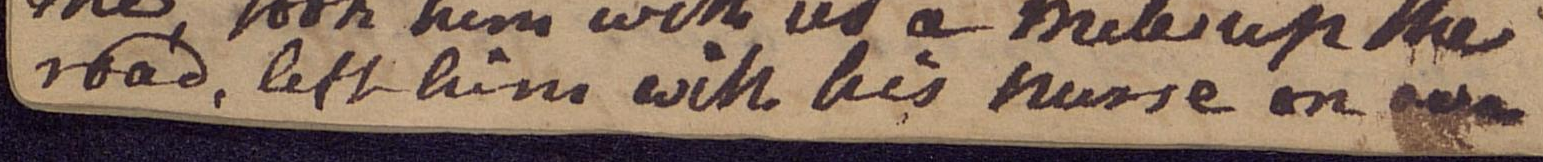road, left him with his nurse on our
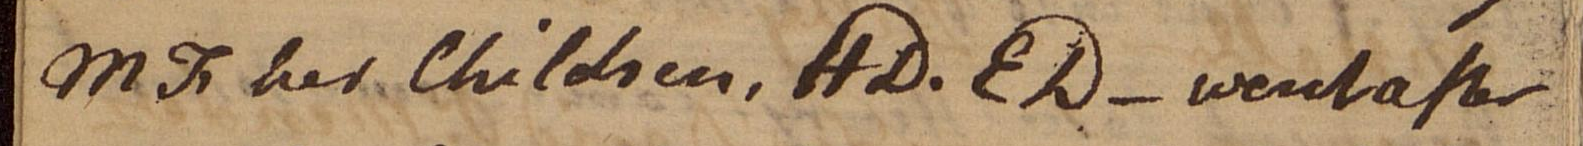MF her Children, HD. ED- went after
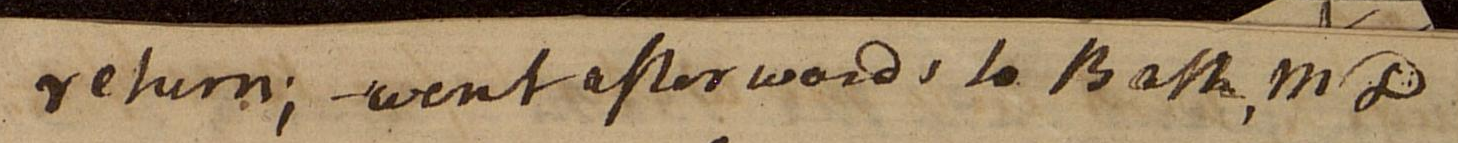return; - went afterwards to Bath, MD
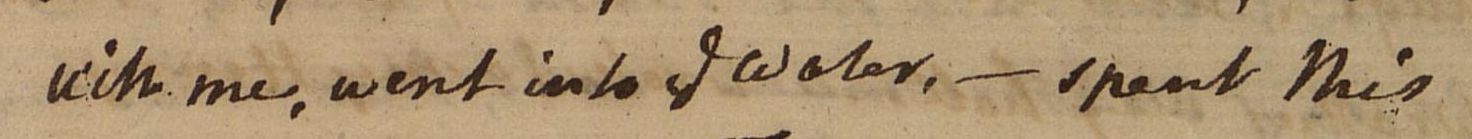with me, went into y^e Water,- spent this
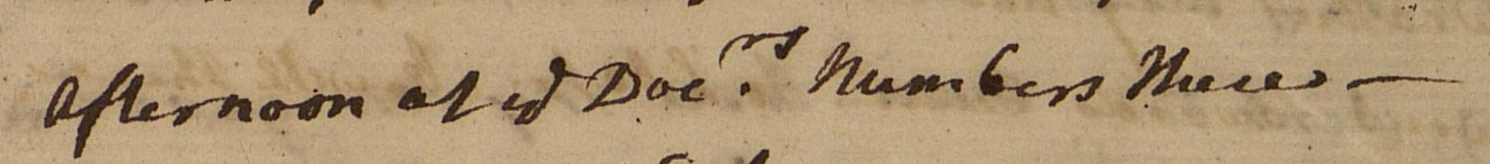afternoon at y^e Doc^r. Numbers there-
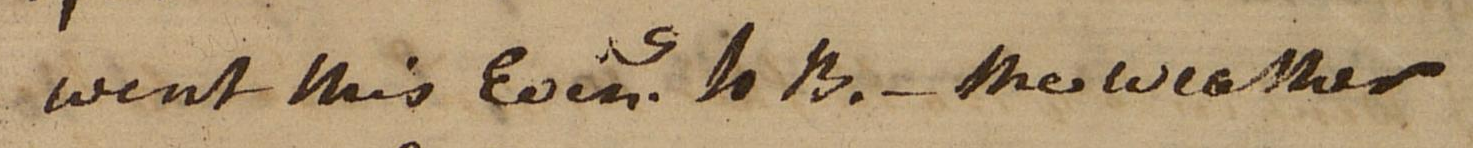went this Even^g. to B.- me weather
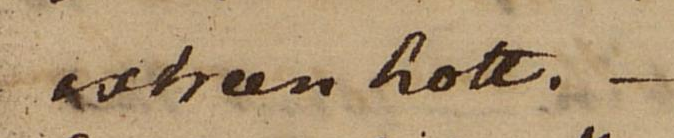extreen hott.-
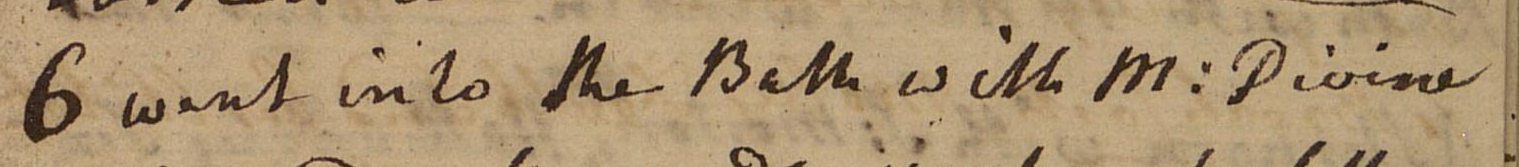6 went into the Bath with M: Divine
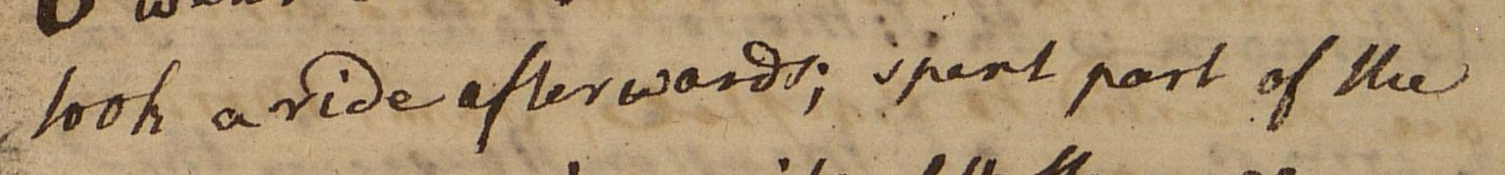took a ride afterwards; spent part of the
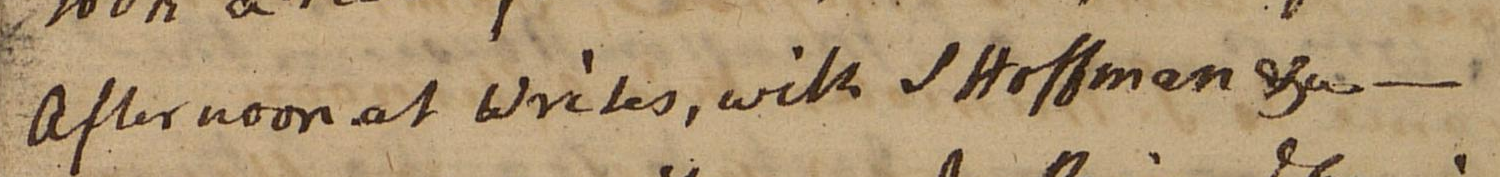Afternoon at Writes, with S Hoffman &c-
